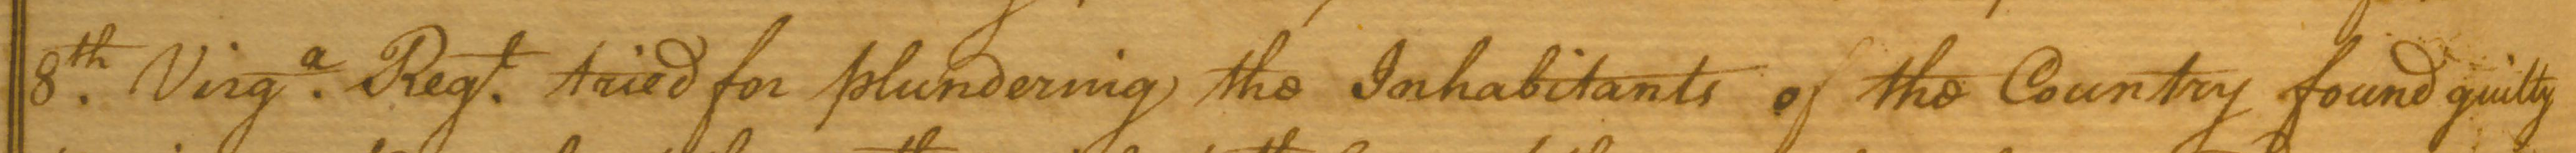8^th. Virg^a. Reg^t. tried for plundering the Inhabitants of the Country found guilty
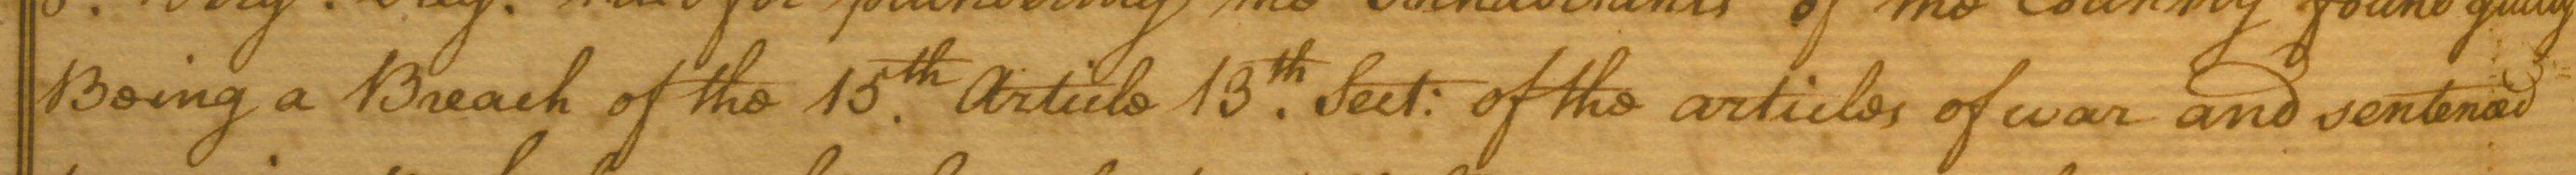Being a Breach of the 15^th. Article 13^th. Sect: of the articles of war and sentenced
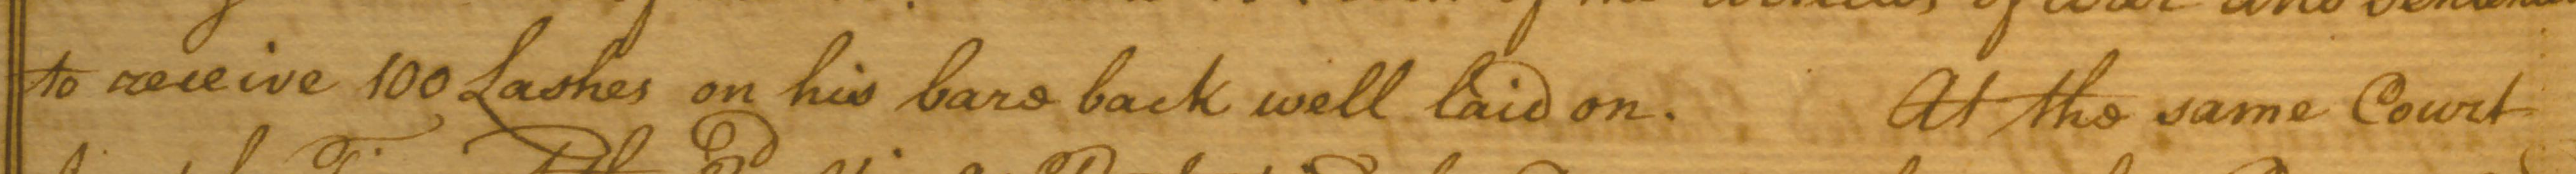to receive 100 Lashes on his bare back well laid on. At the same Court
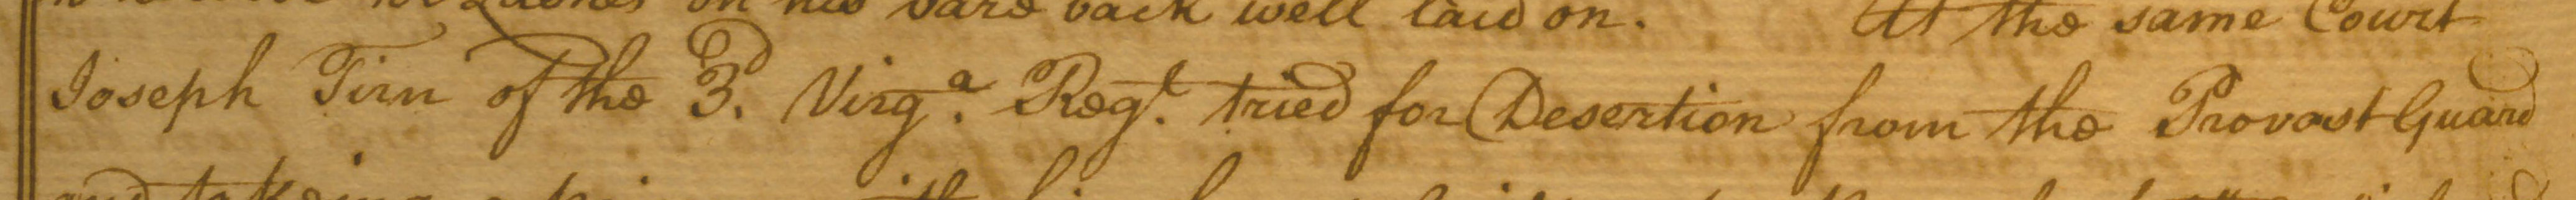Joseph Tirn of the 3^d. Virg^a. Reg^t. tried for Desertion from the Provost Guard
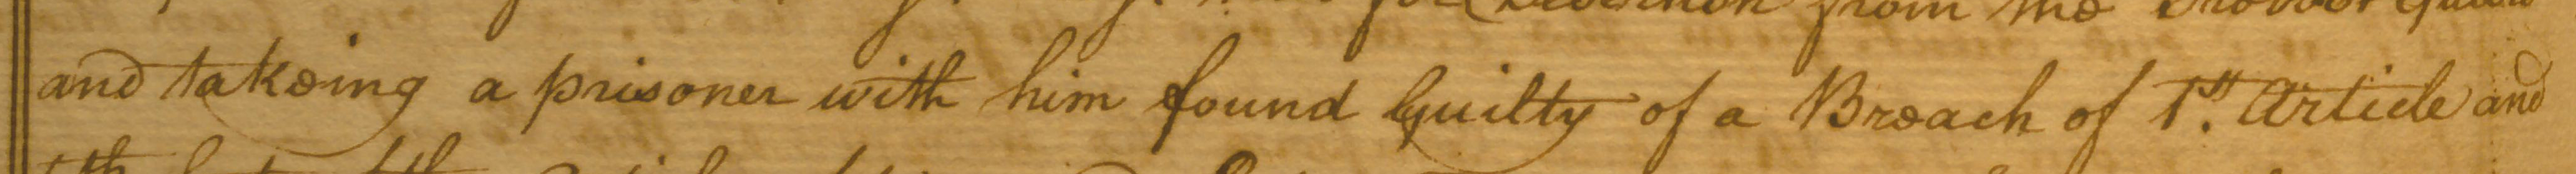and takeing a prisoner with him found Guilty of a Breach of 1^st. Article and
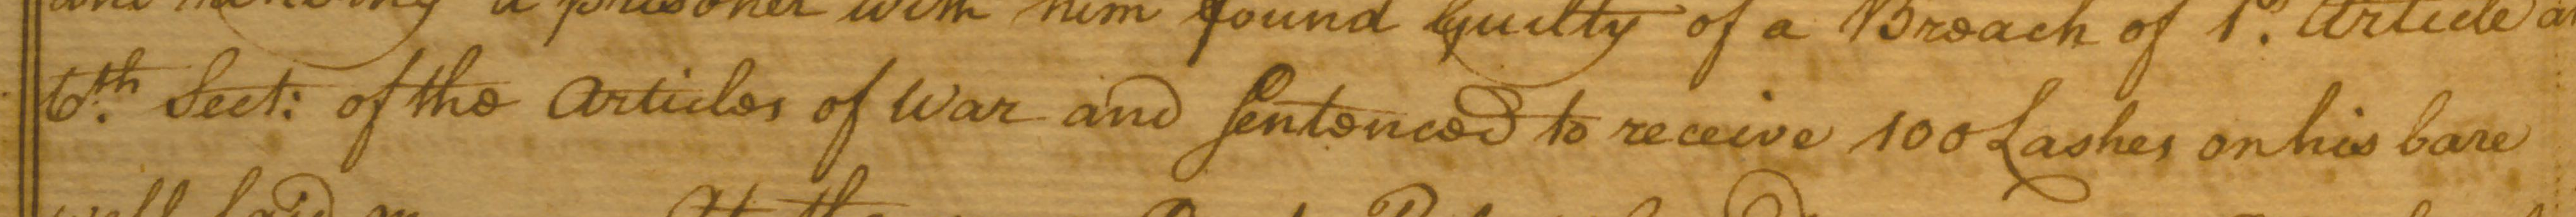6^th. Sect: of the Articles of War and sentenced to receive 100 Lashes on his bare
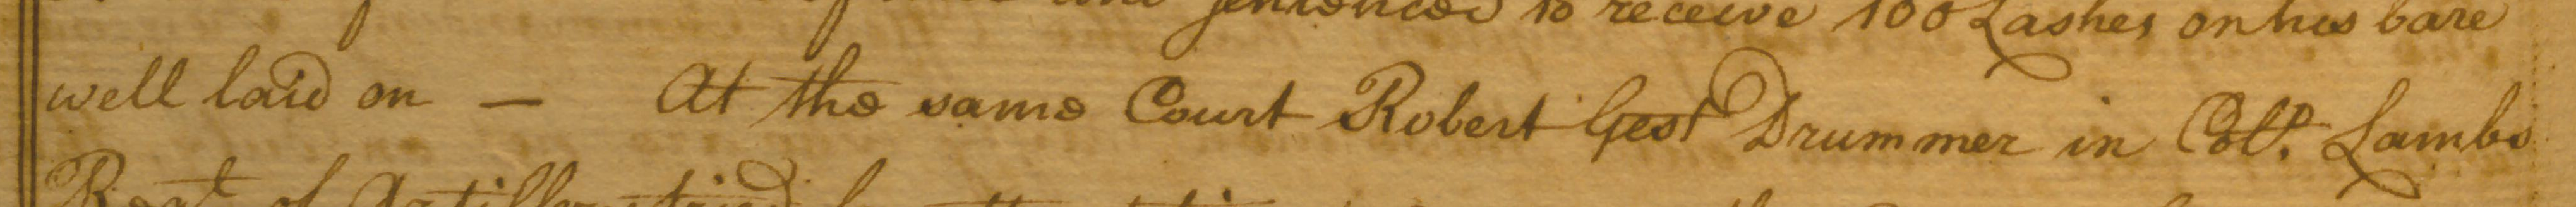well laid on- At the same Court Robert Gest Drummer in Col^o. Lambs
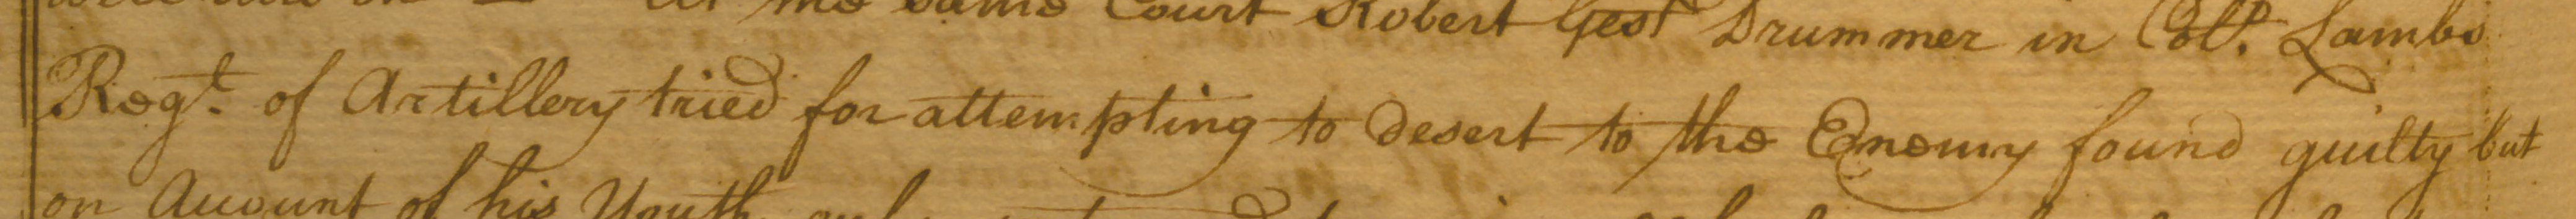Reg^t. of Artillery tried for attempting to desert to the Enemy found guilty but
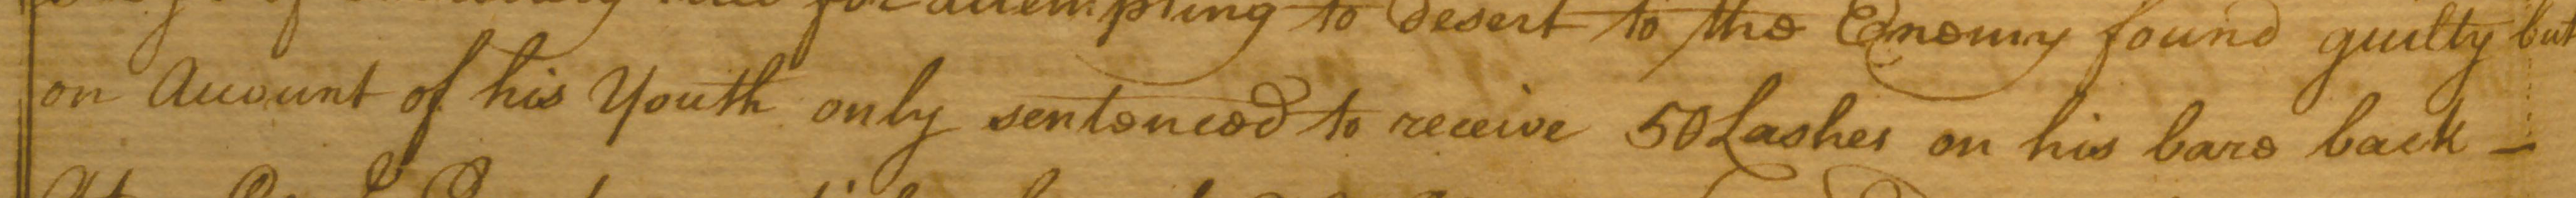on Account of his Youth only sentenced to receive 50 Lashes on his bare back-
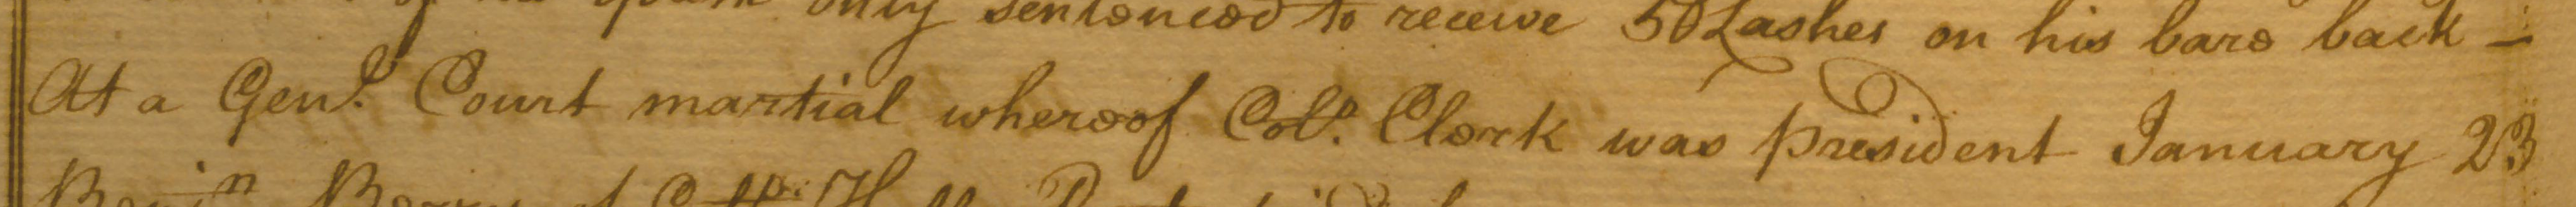At a Gen^l. Court martial whereof Col^o. Clerk was president January 23
